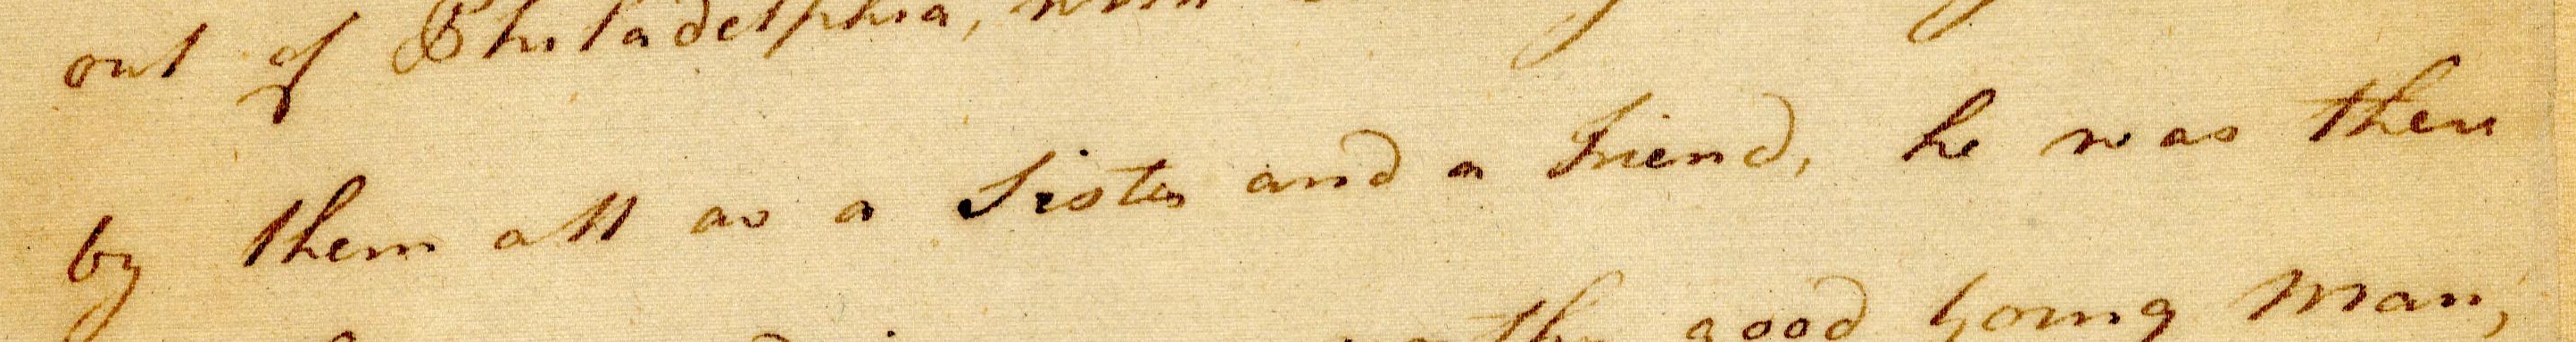by them all as a Sister and a Friend, he was there
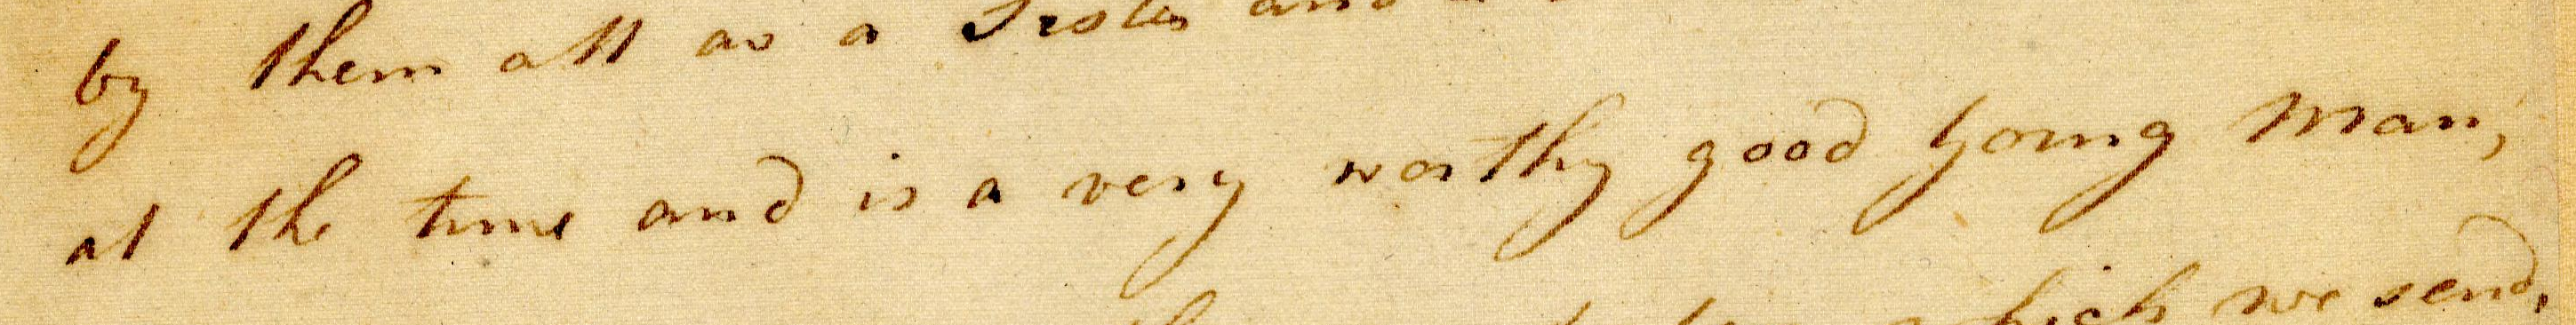at the time and is a very worthy good young Man,
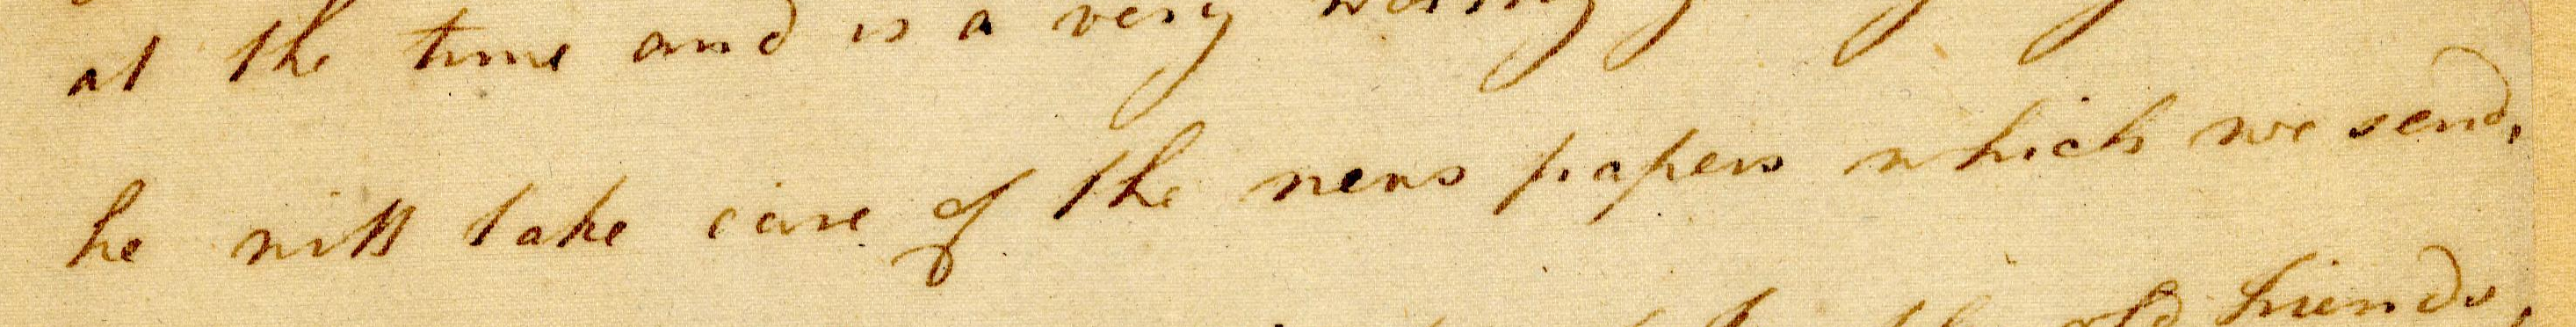he will take care of the news papers which we send,
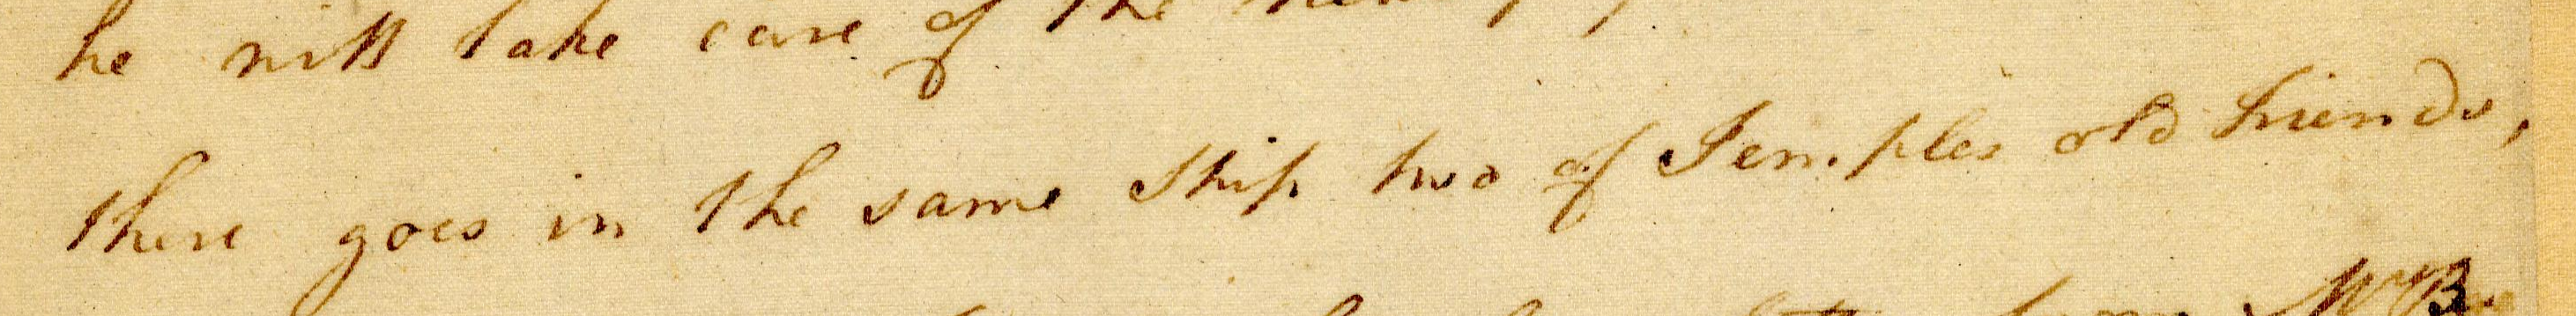there goes in the same Ship two of Temples old Friends,
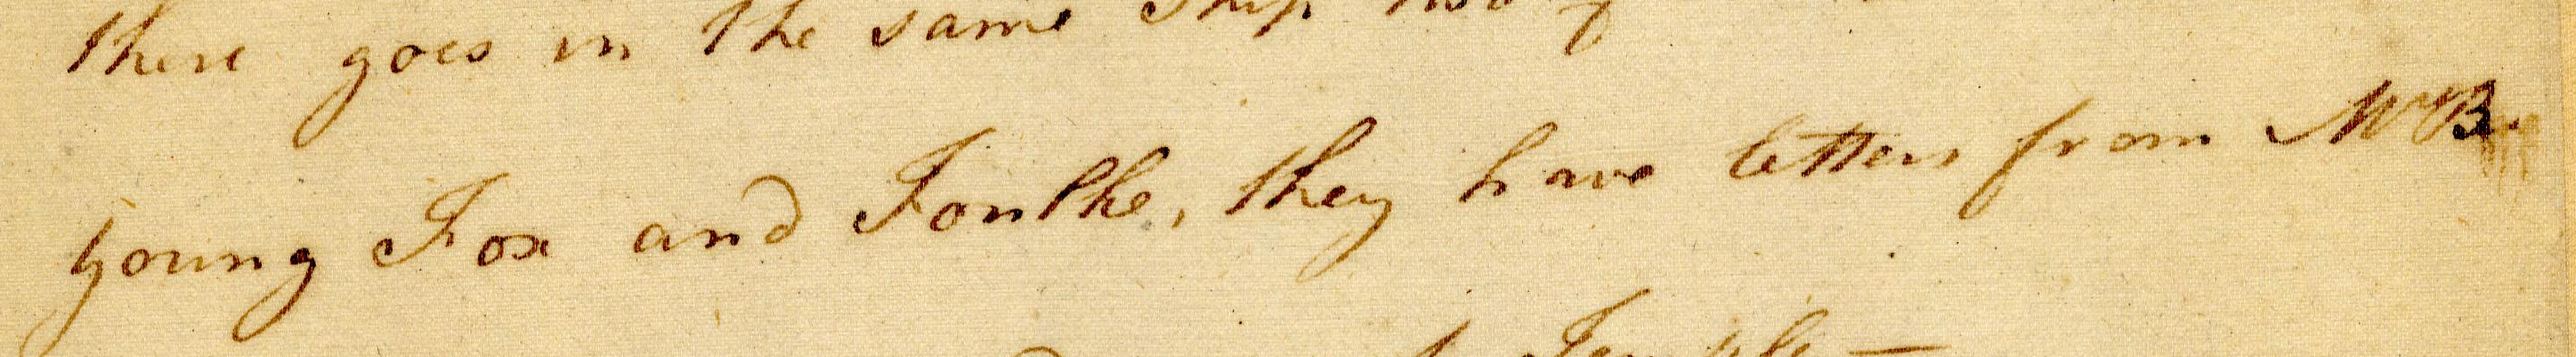Young Fox and Fonthe, they have letters from M^r B.
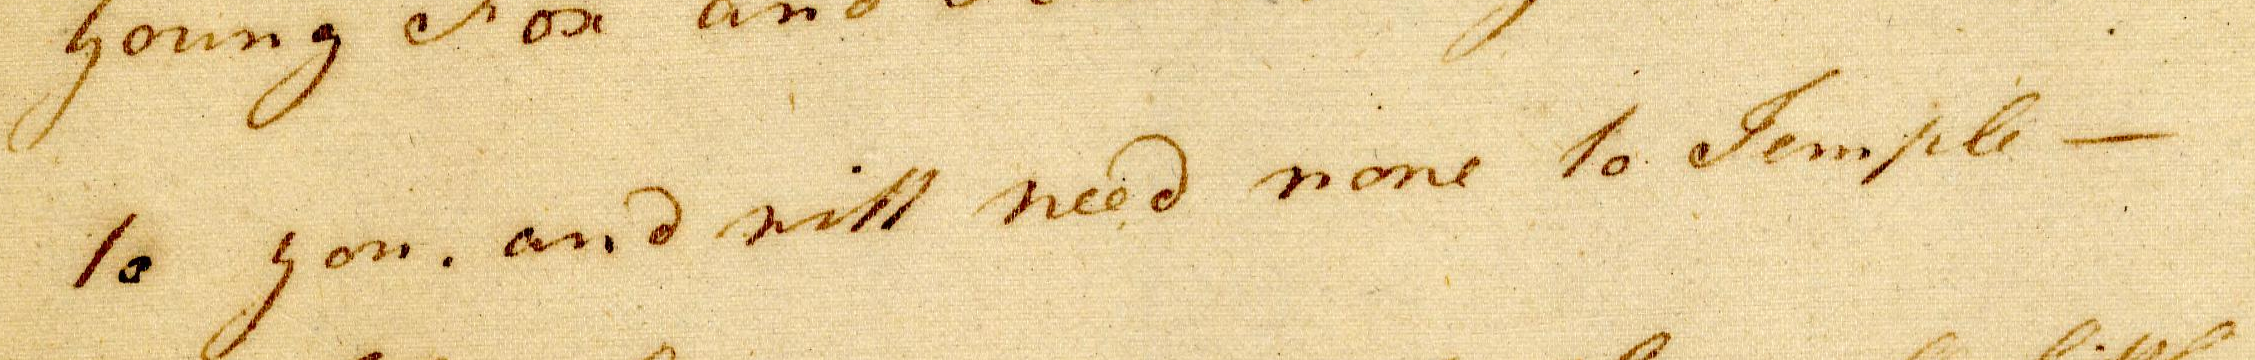to you. and will need none to Temple-
